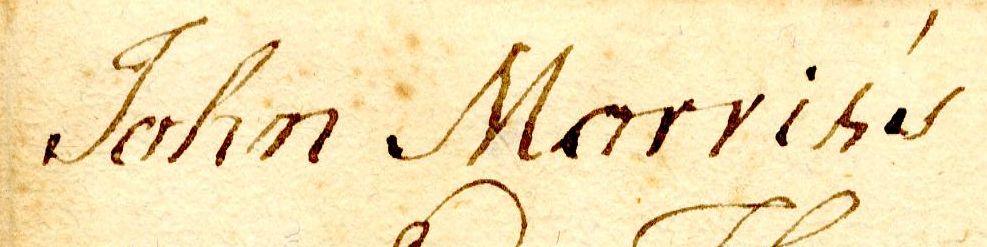John Morris'es
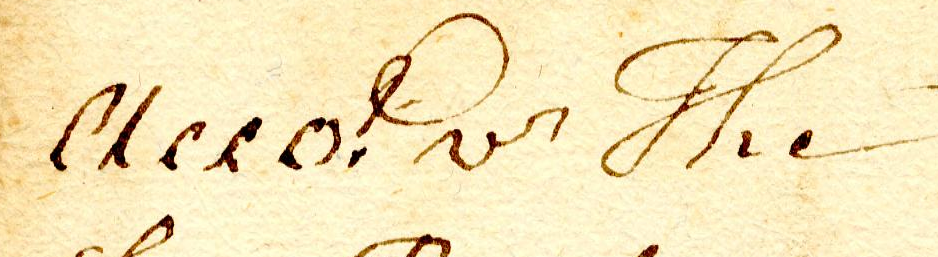Acco^t of The
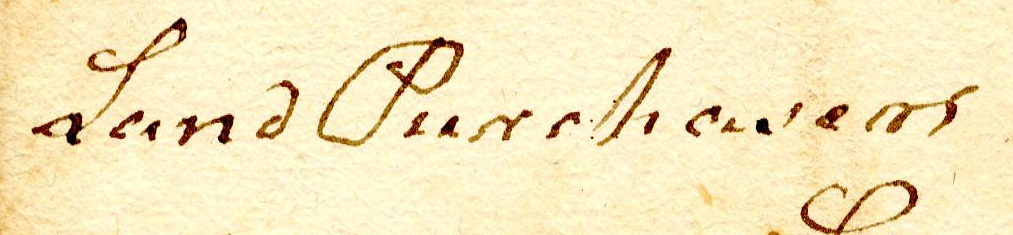Land Purchases
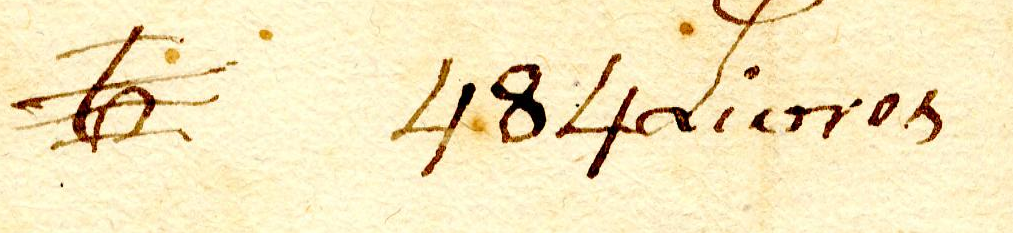[6] 484 Livres
